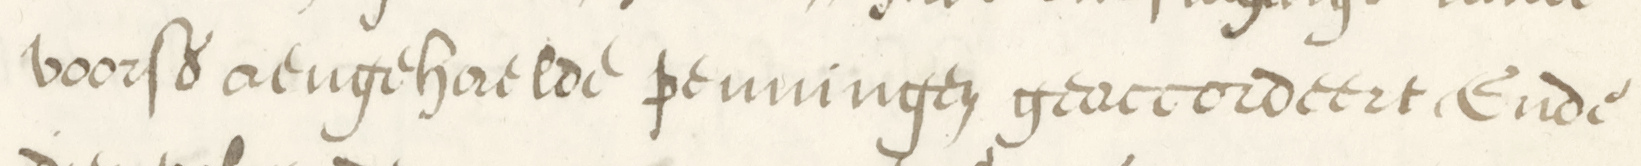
voors aengehaelde penningen geaccordeert. Ende
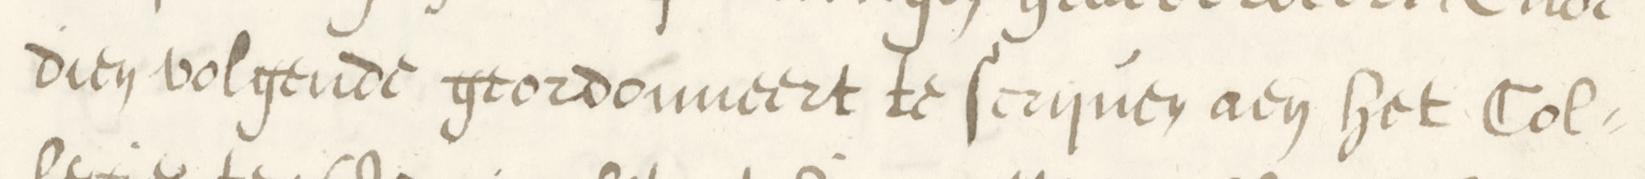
dien volgende geordonneert te scryuen aen het Col„
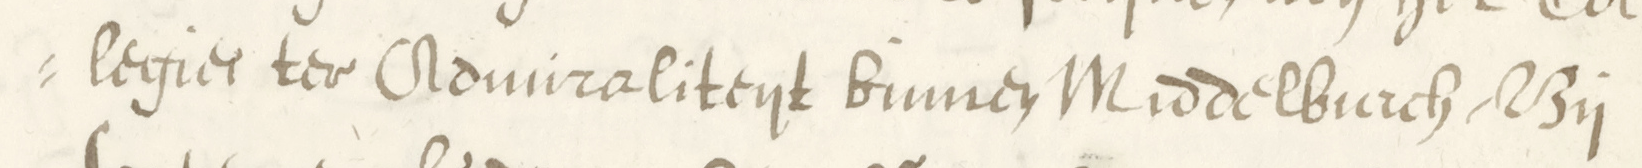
,,legien ter Admiraliteyt binnen Middelburch, Bij
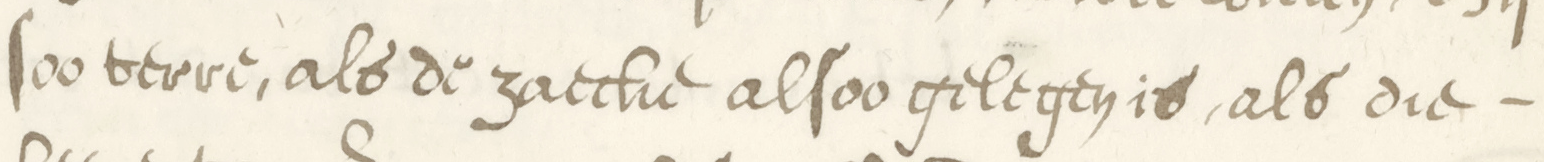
soo verre, als de zaecke alsoo gelegen is, als die -
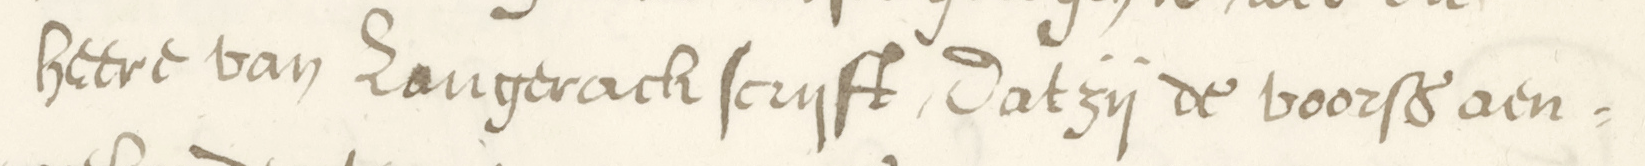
heere van Langerack scryft, dat zij de voors aen„
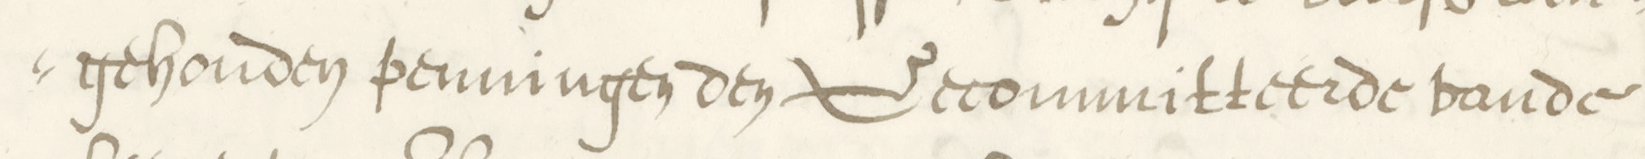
,,gehouden penningen den Gecommitteerde vande
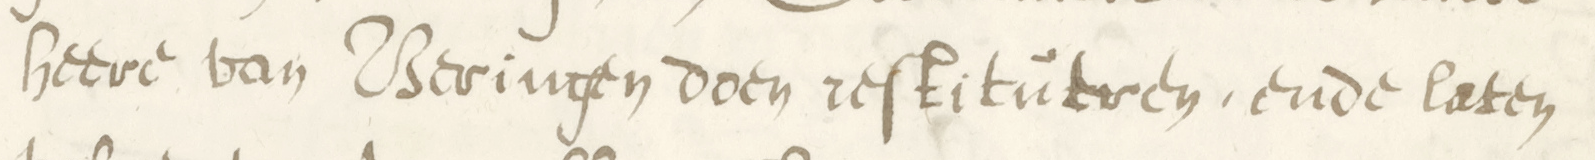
heere van Beringen doen restitueren, ende laten
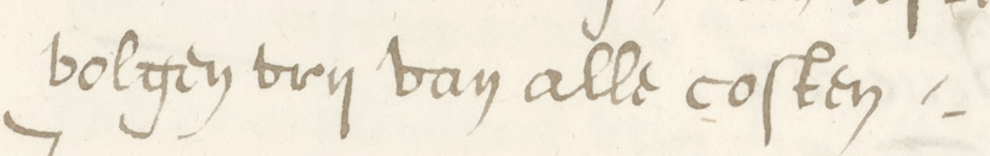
volgen vry van alle costen.
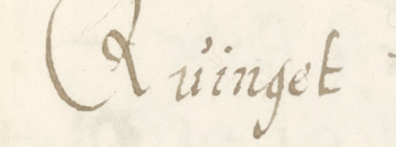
Quinget
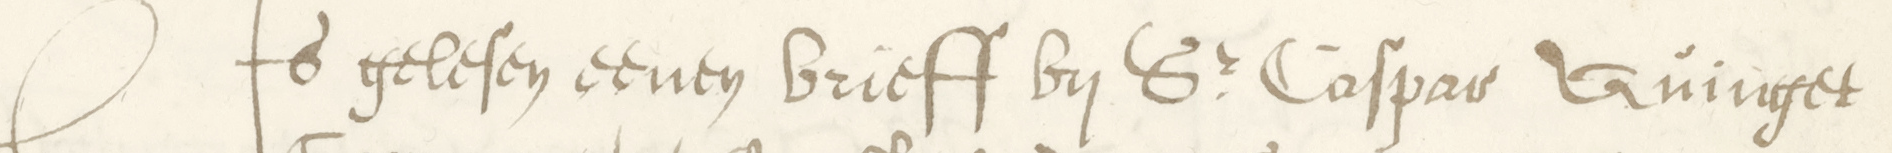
Is gelesen eenen brieff by Sr. Caspar Quinget
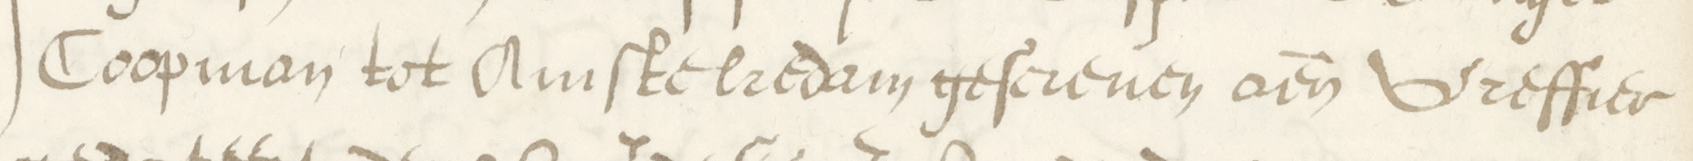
Coopman tot Amstelredam gescreuen aen Greffier
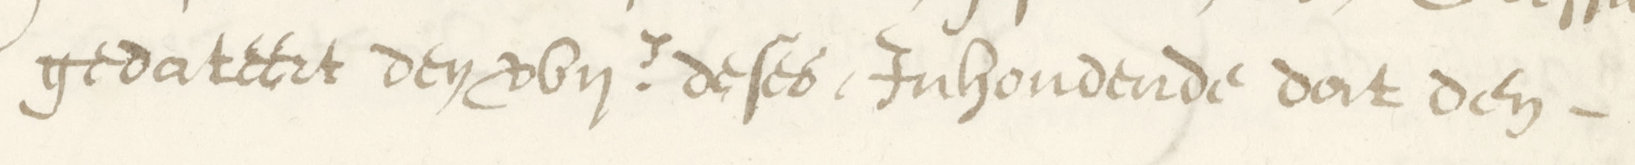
gedateert den xvijen. deses, Inhoudende dat den —
